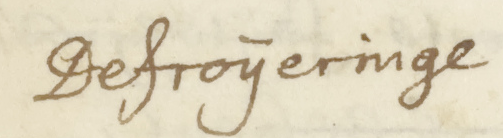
Defroijeringe
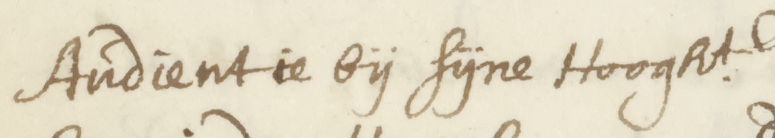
Audientie bij sijne Hooght.
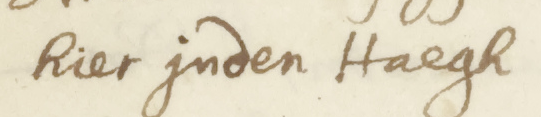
hier inden Haegh
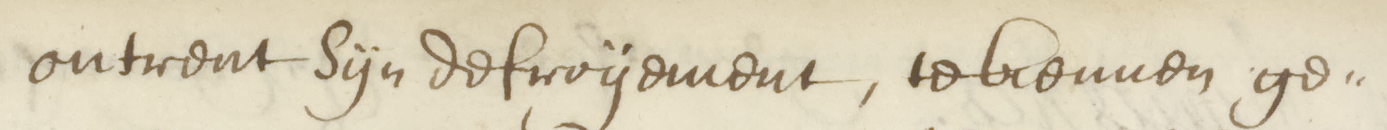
ontrent sijn defroijement, te kennen ge„
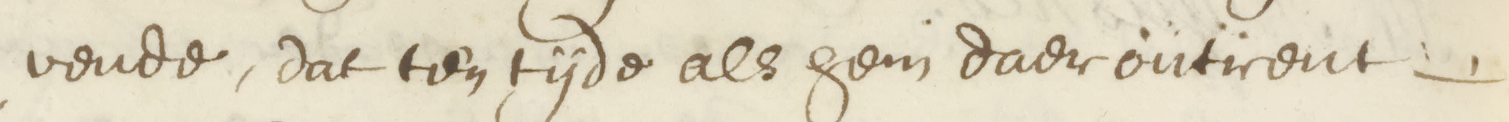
vende, dat ten tijde als hem daer ontrent
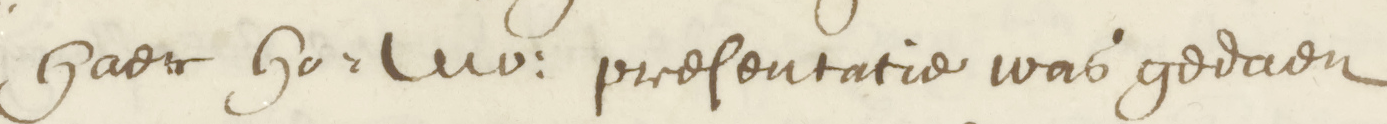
haer ho:Mo: presentatie was gedaen
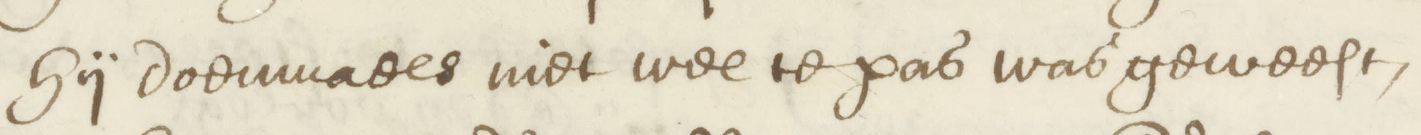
hij doenmaels niet wel te pas was geweest,
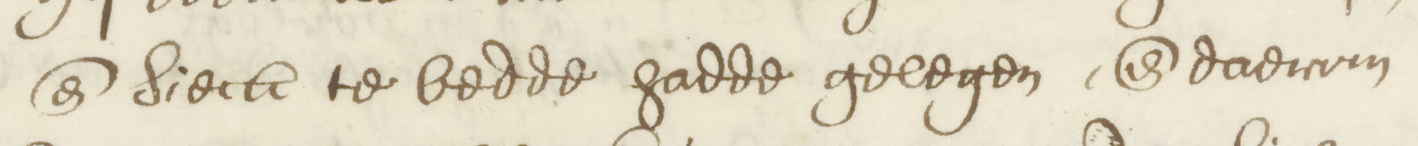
& Sieck te bedde hadde gelegen, & daerom
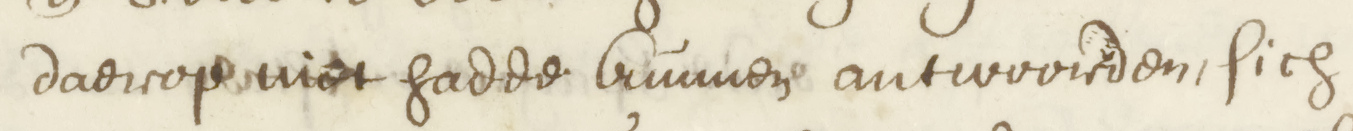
daerop niet hadde kunnen antwoorden, sich
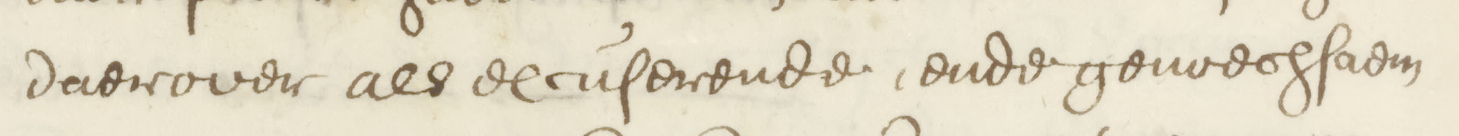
daerover als excuserende, ende genoechsaem
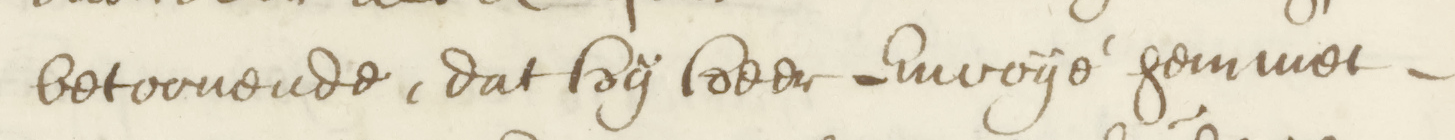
betoonende, dat hij heer Envoijé hem met
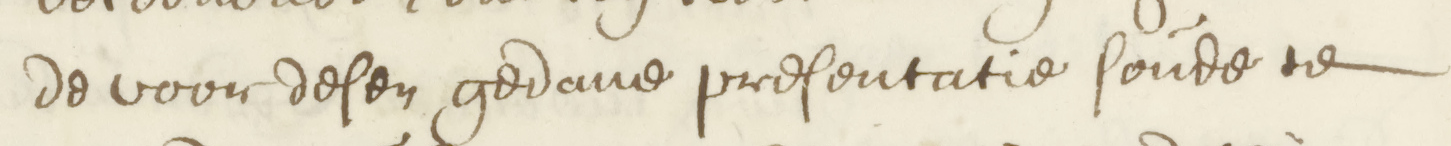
de voor desen gedane presentatie soude te
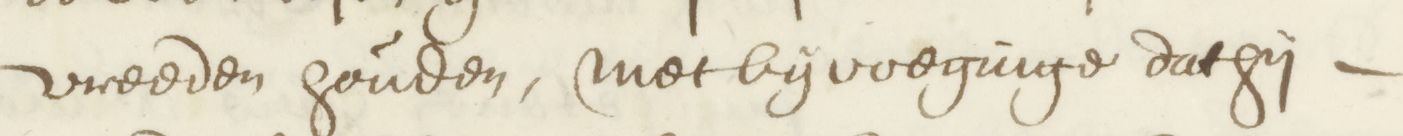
vreeden houden, met bijvoeginge dat hij
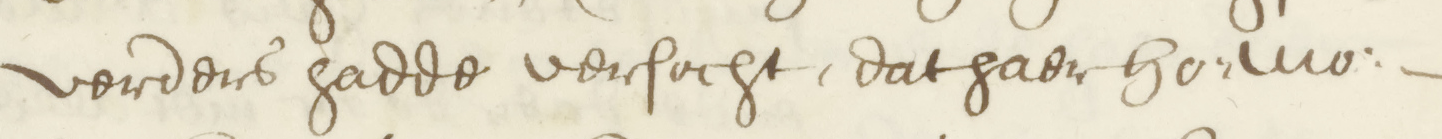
verders hadde versocht, dat haer ho:mo:
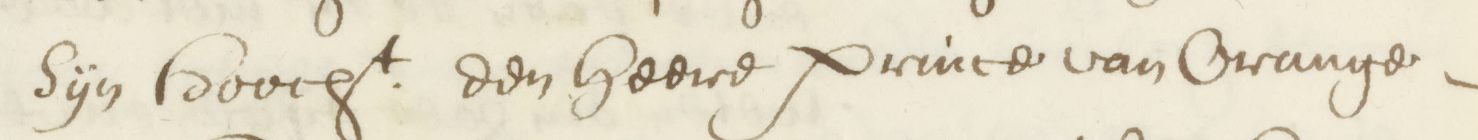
sijn hoocht. den heere Prince van Orange
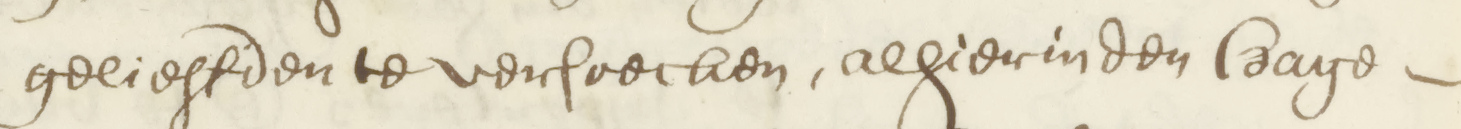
gelieffden te versoecken, alhier in den Hage
